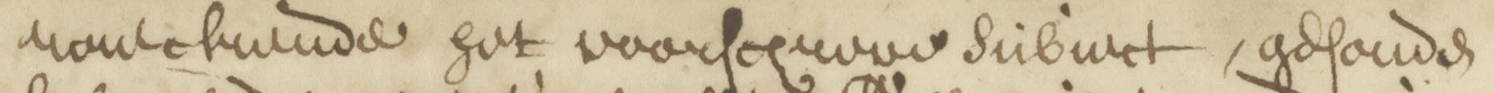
raeckende het voorschreve subiect, gesonden
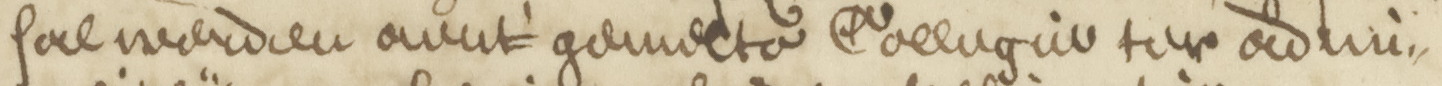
sal werden aent gemelte Collegie ter admi,,
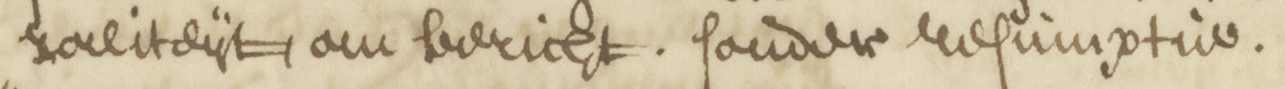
raliteijt, om bericht. sonder resumptie.
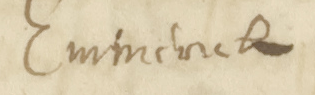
Emmerick
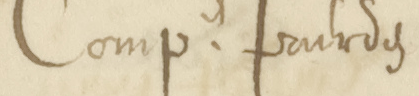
Compen. paerden
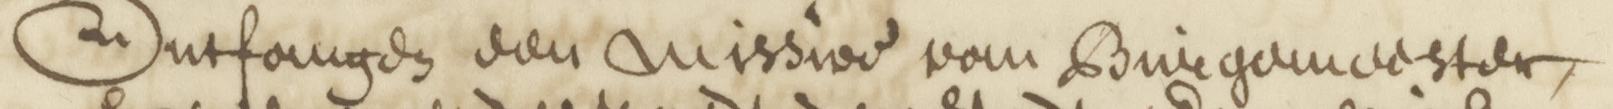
Ontfangen een missive van Burgemeester,
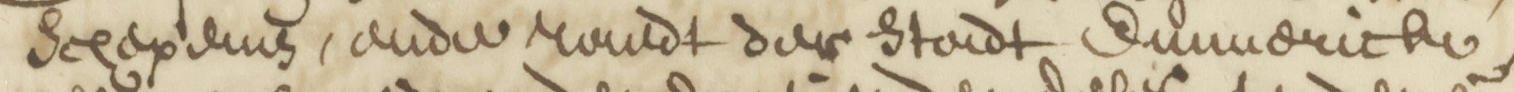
Schepenen, ende raedt der Stadt Emmerick
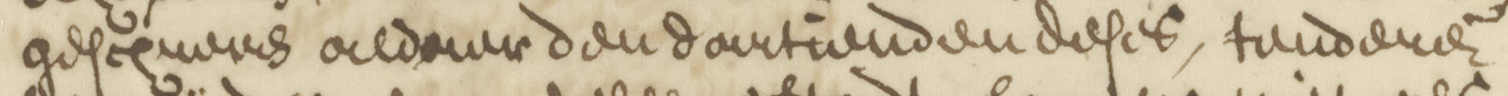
geschreven aldaer den dartienden deses, tenderen
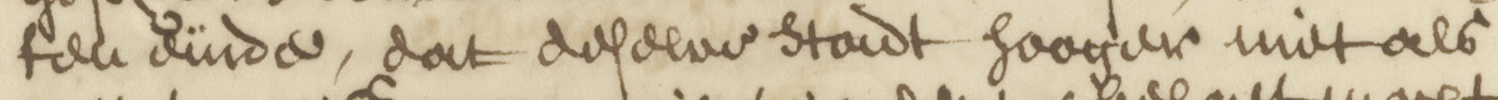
ten einde, dat deselve stadt hooger niet als
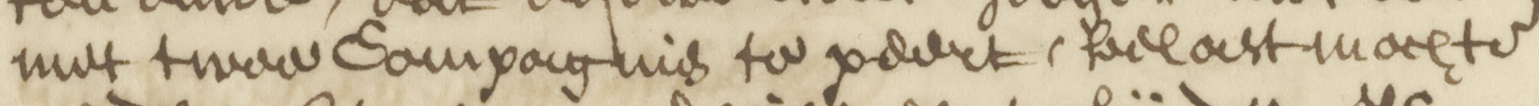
met twee Compagnien te peert, belast mochte
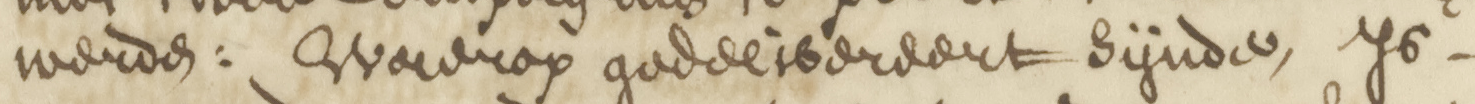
werden: Waerop gedelibereert sijnde, Is
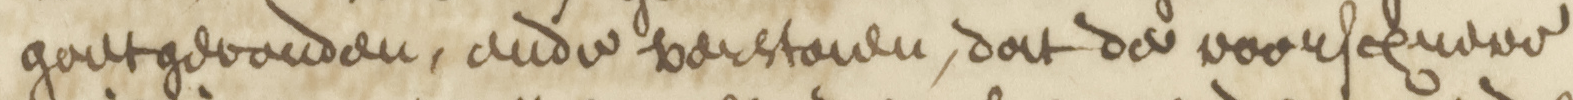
goetgevonden, ende verstaen, dat de voorschreve
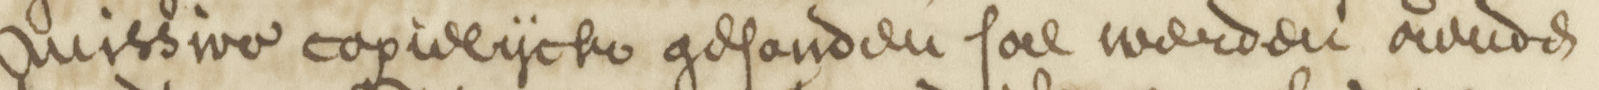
missive copielijck gesonden sal werden aenden
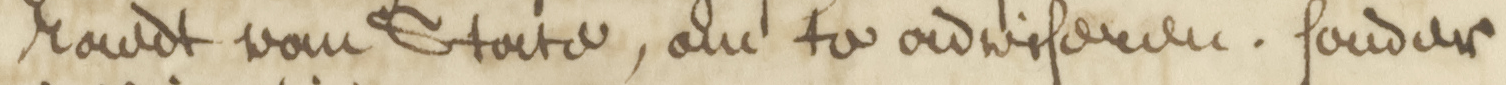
raedt van State, om te adviseren, sonder
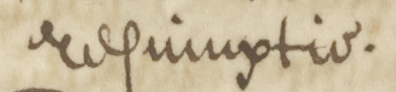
resumptie.
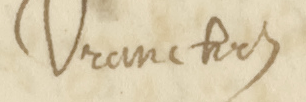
Vranckr
